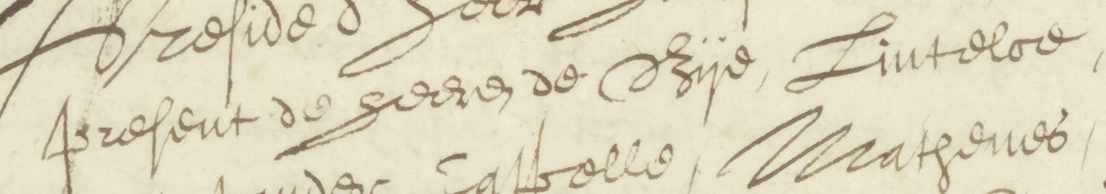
present de heeren de Bije, Linteloe,
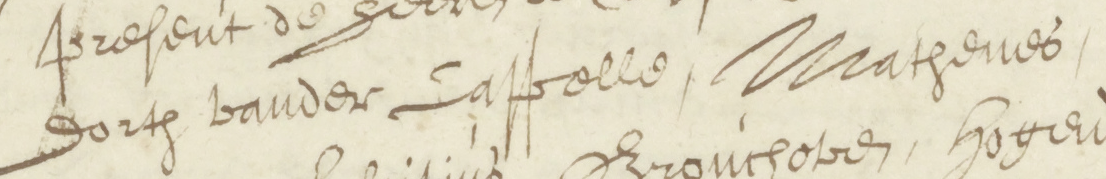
Dorth vander Capelle, Mathenes,
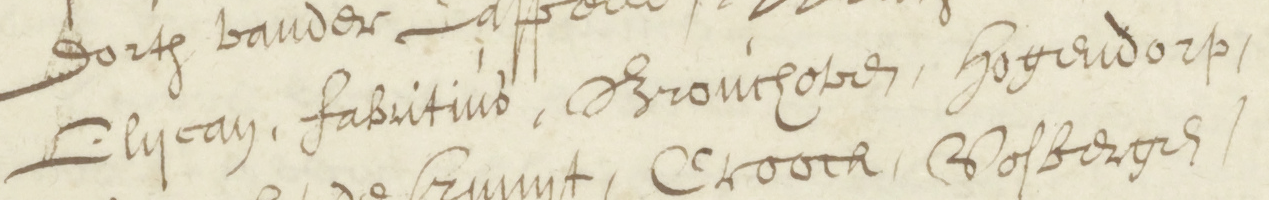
Olycan, Fabritius, Brouchoven, hogendorp,
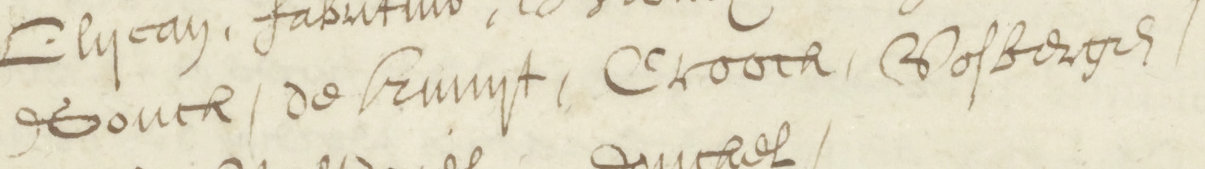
Sonck, de Kruyt, Croock, Vosbergen,
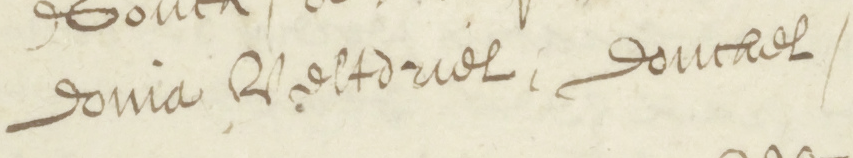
Donia, Veltdriel, Donckel.
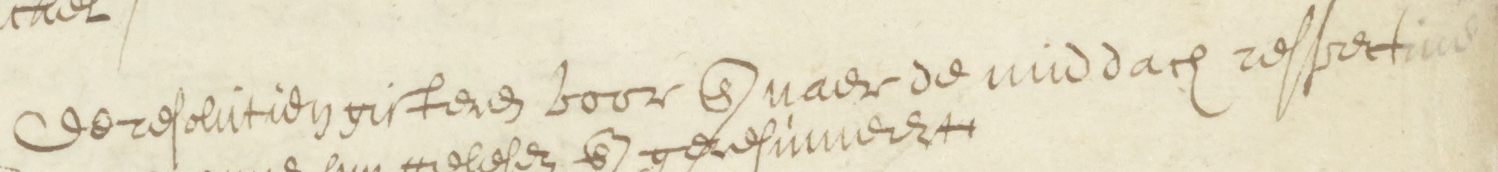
De resolutien gisteren voor & naer de middach respectiue
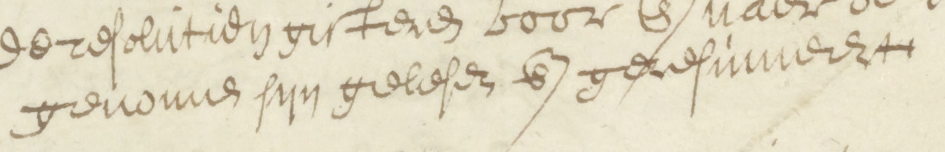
genomen syn gelesen & geresumeert
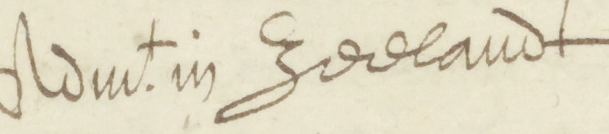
Adm.t in Zeelandt
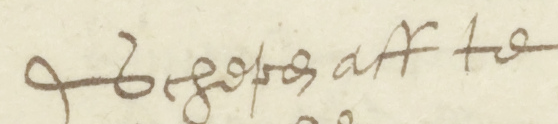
Schepen aff te
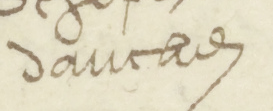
dancken
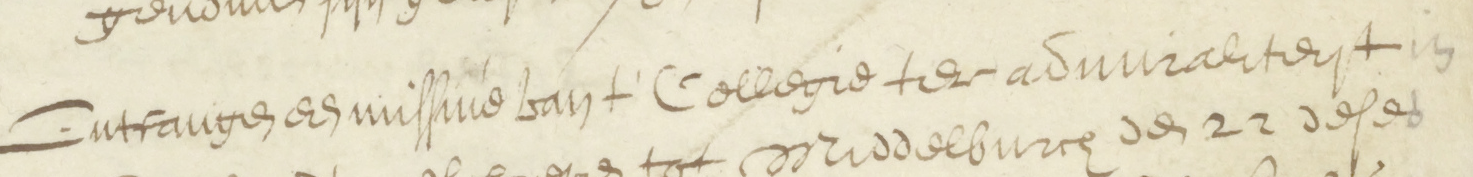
Ontfangen een missiue van t' Collegie ter admiraliteyt in
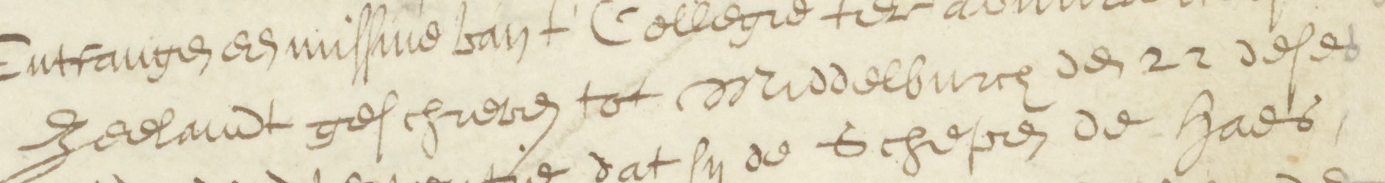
Zeelandt geschreven tot Middelburch den 22 deses
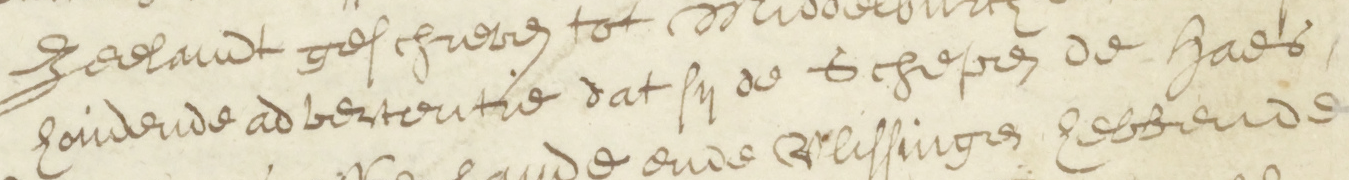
houdende advertentie dat sy de Schepen de Haes,
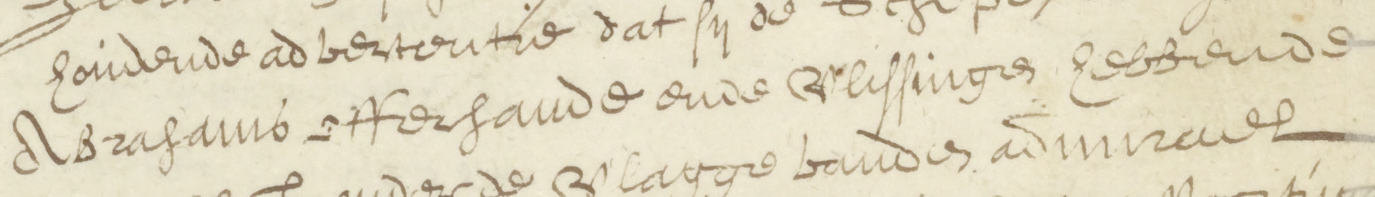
Abrahams offerhande ende Vlissingen hebbende
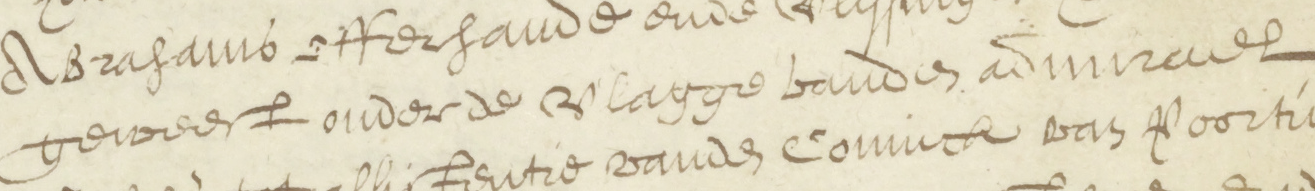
geweest onder de Vlagge vanden Admirael
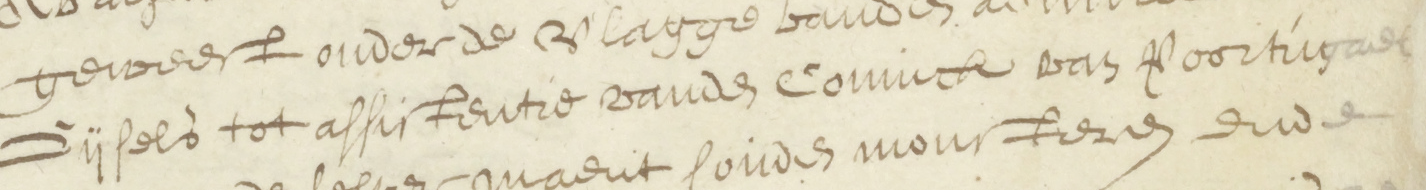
Gijssels tot assistentie vanden Coninck van Poortugael
